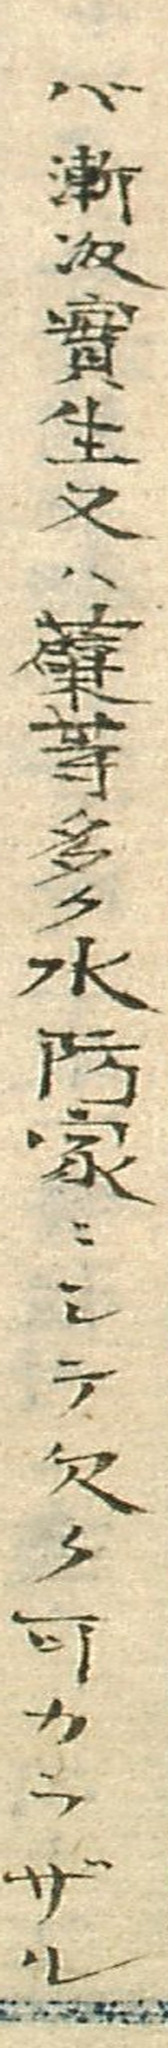バ漸次実生又ハ蘗等多ク水防家ニシテ欠ク可カラザル
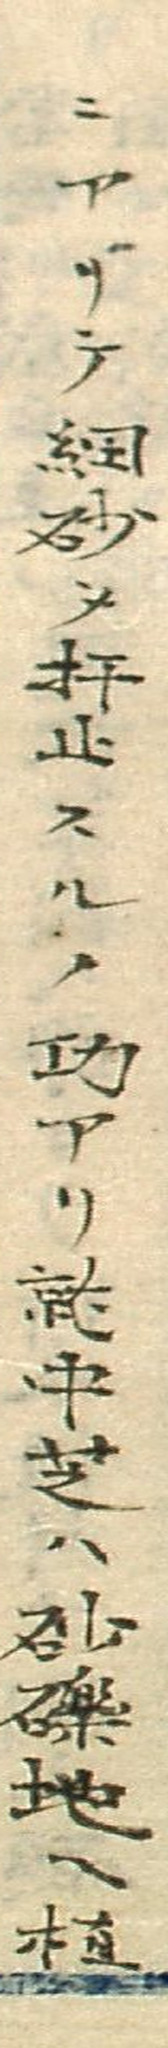ニアリテ細砂ヲ扞止スルノ功アリ就中芝ハ砂礫地ヘ植
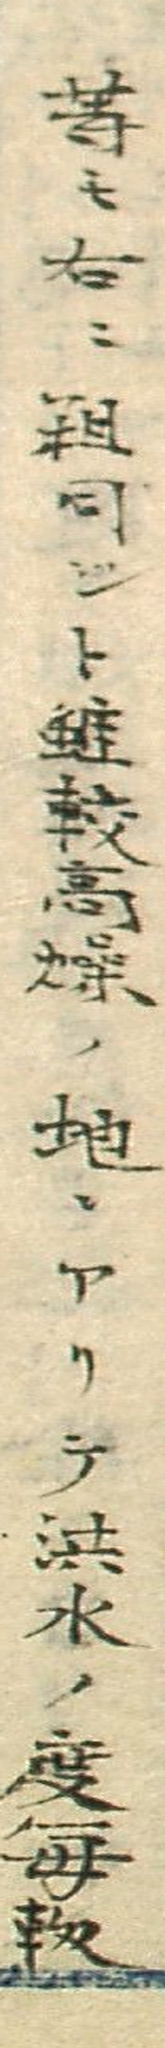等モ右ニ粗同ジト雖較高燥ノ地ニアリテ洪水ノ度毎軟
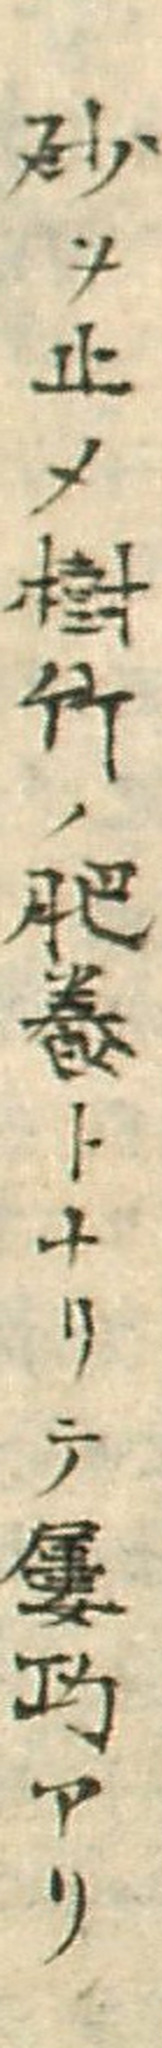砂ヲ止メ樹竹ノ肥養トナリテ屡功アリ

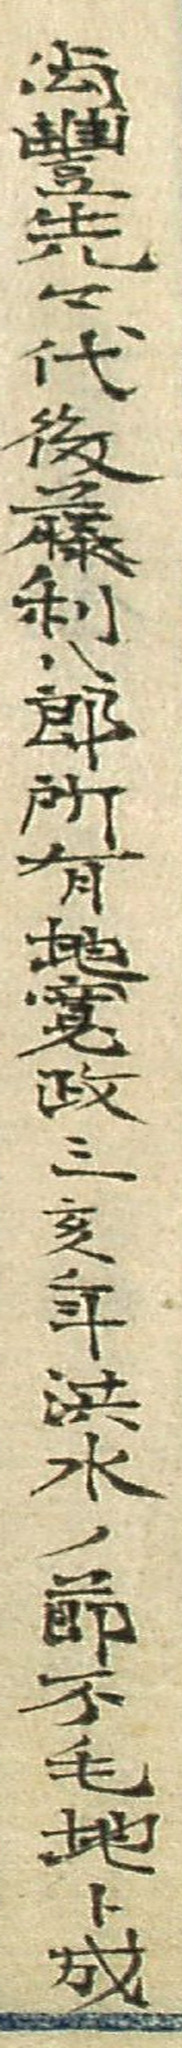尚豊先々代後藤利八郎所有地寛政三亥年洪水ノ節不毛地ト成
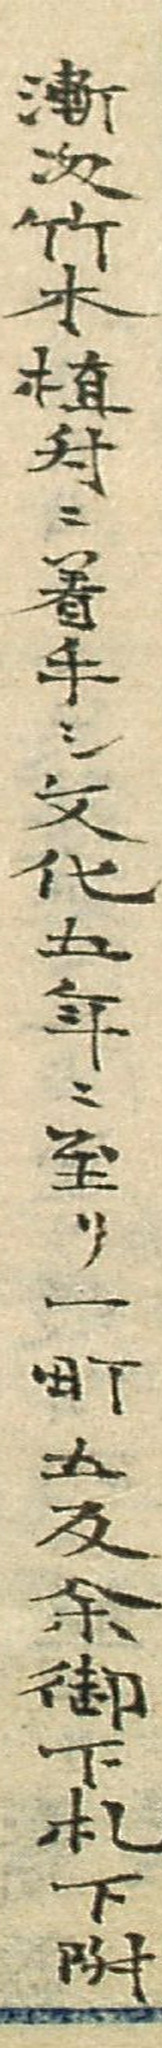漸次竹木植付ニ着手シ文化五年ニ至リ一町五反余御下札下附
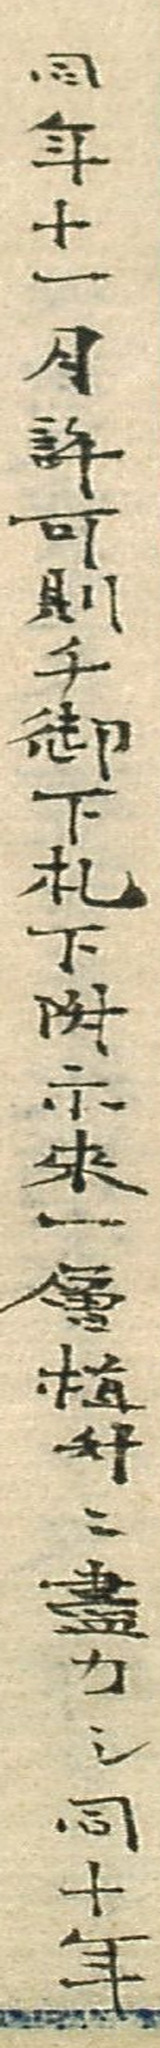同年十一月許可則チ御下札下附示来一層植付ニ尽力シ同十年
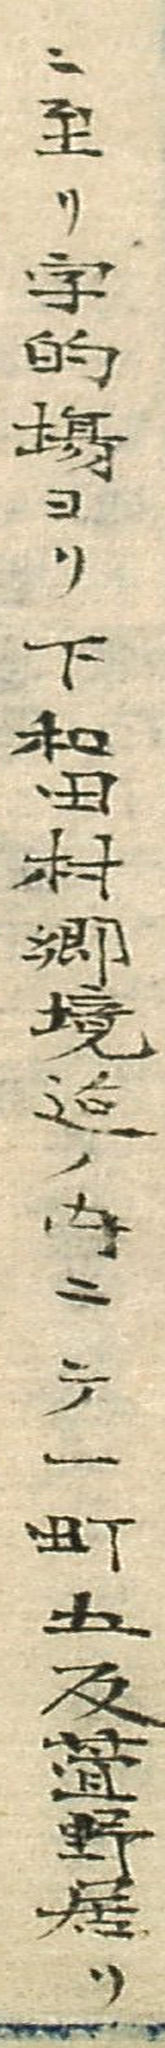ニ至リ字的場ヨリ下和田村郷境迄ノ内ニテ一町五反萱野居リ
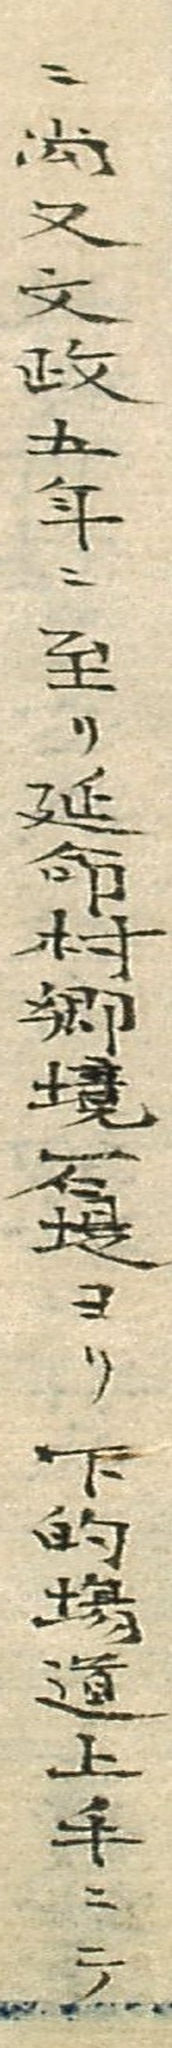ニ尚又文政五年ニ至リ延命村郷境石堤ヨリ下的場道上手ニテ
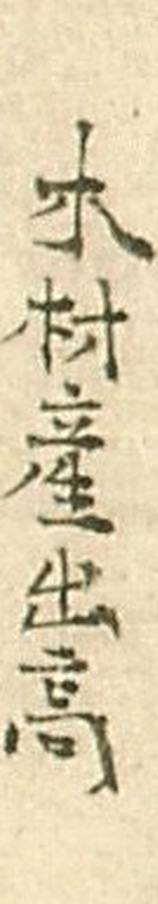木材産出高
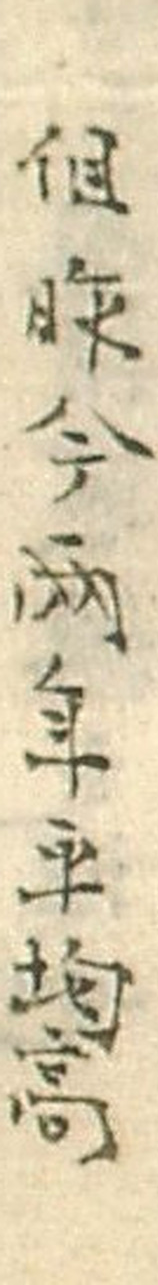但昨今両年平均高
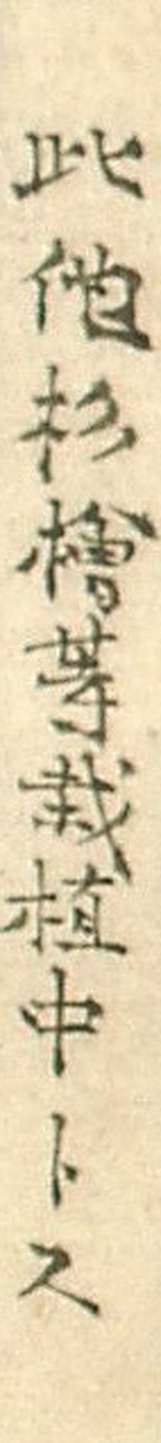此他杉檜等栽植中トス

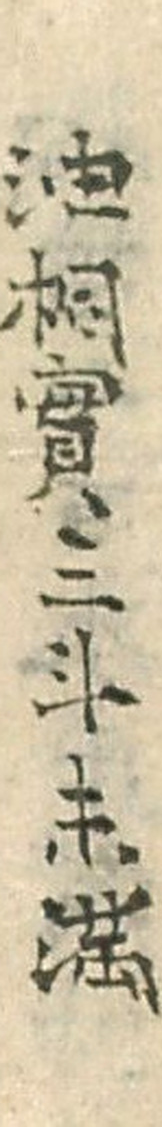油桐実三斗未満
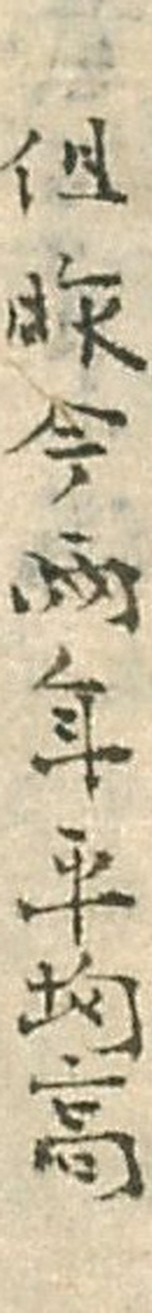但昨今両年平均高
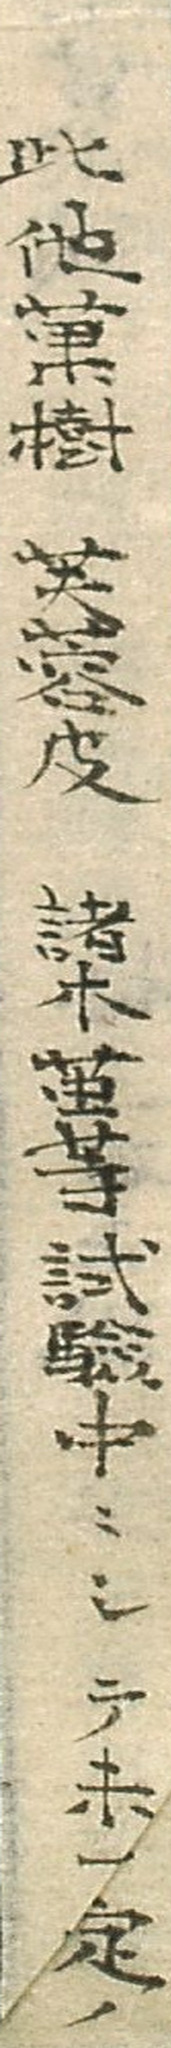此他菓樹芙蓉皮諸木苗等試験中ニシテ未一定ノ
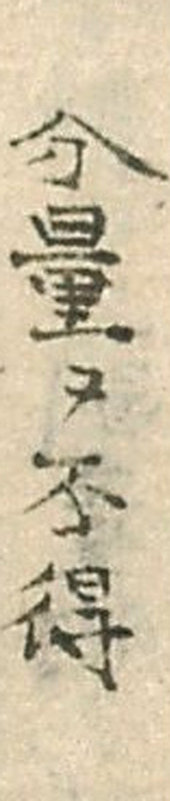分量ヲ不得
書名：山林共進会取調書
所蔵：鳴門教育大学 Naruto University of Education
